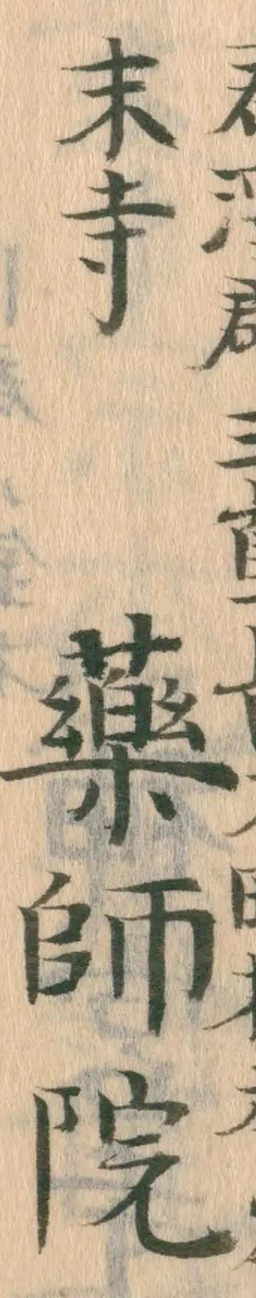未寺薬師院
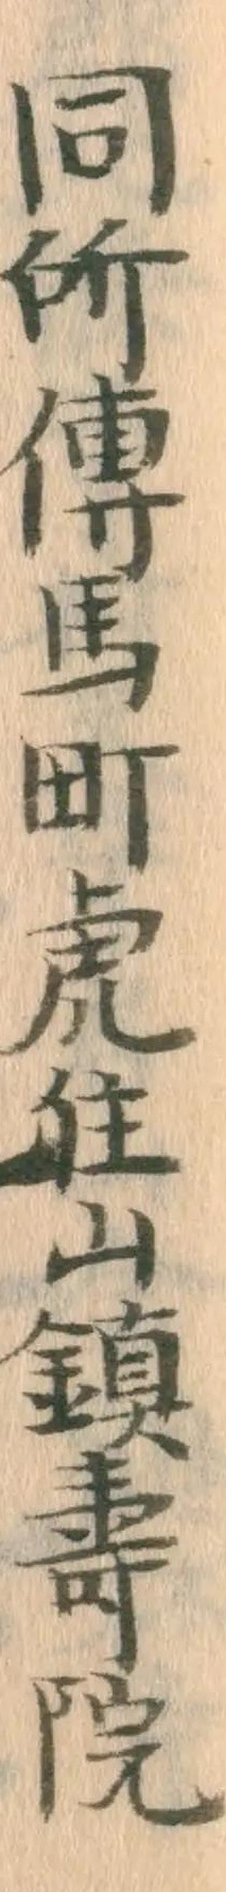同所伝馬町虎狂山鎭寿院
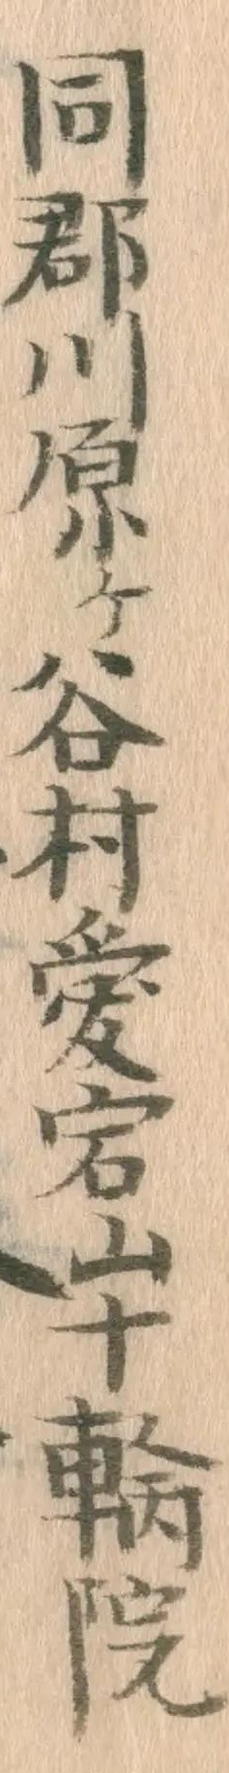同郡川原ケ谷村愛宕山十輪院
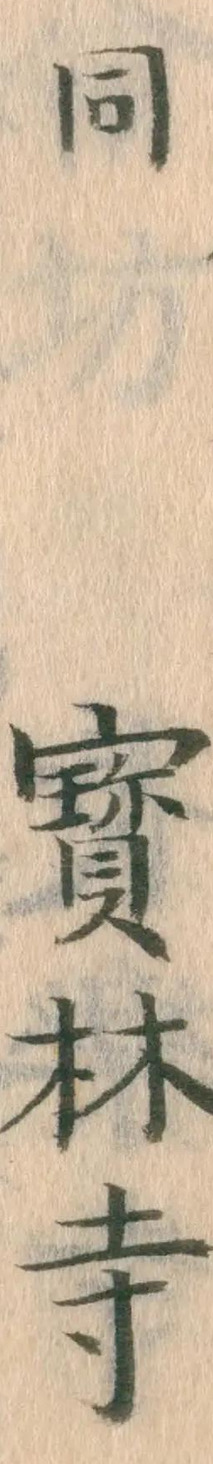同寶林寺
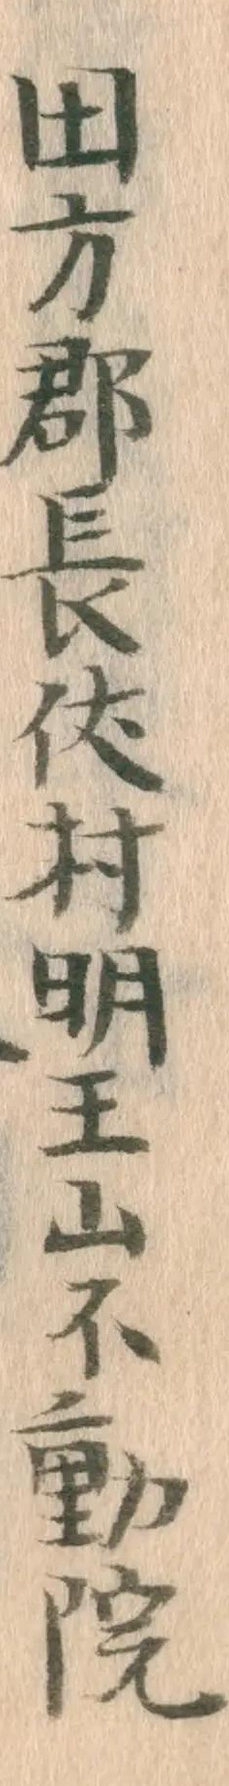田方郡長伏村明王山不動院
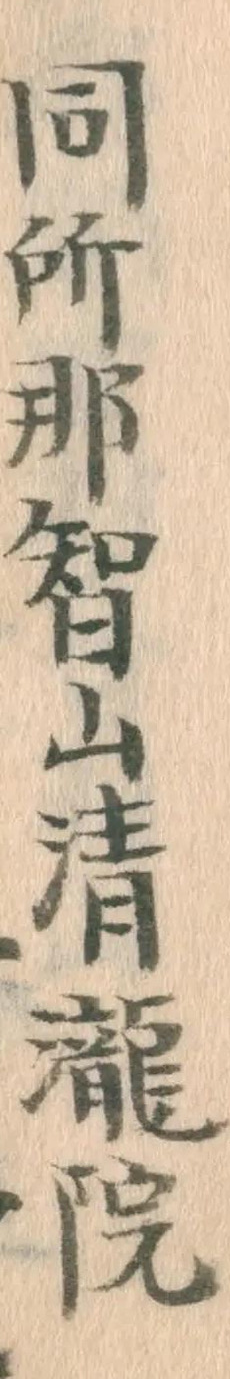同所那智山清瀧院

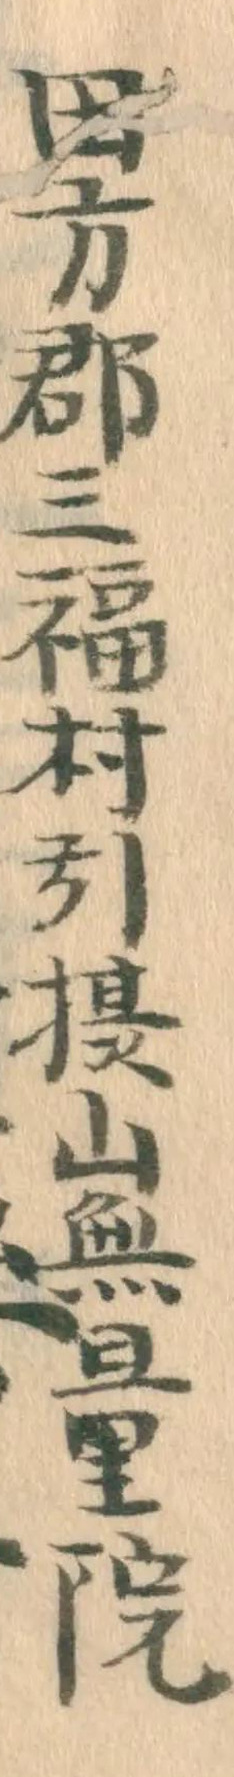田方郡三福村引摂山無量院
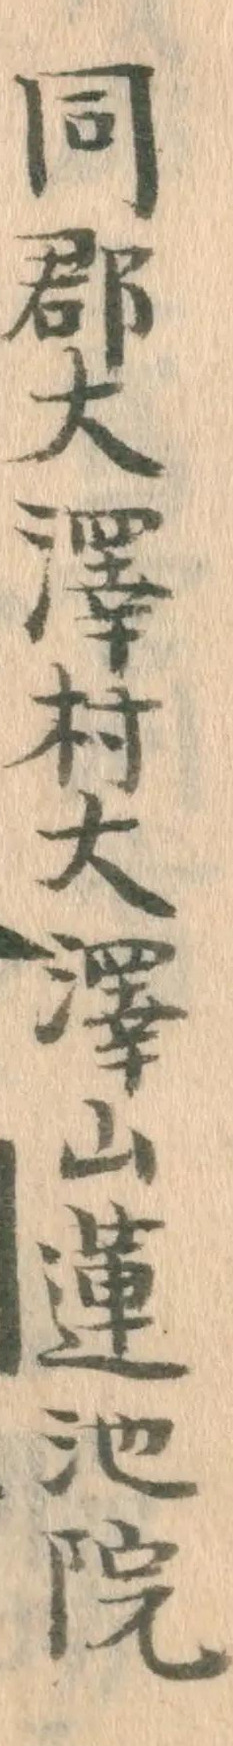同郡大沢村大沢山蓮池院
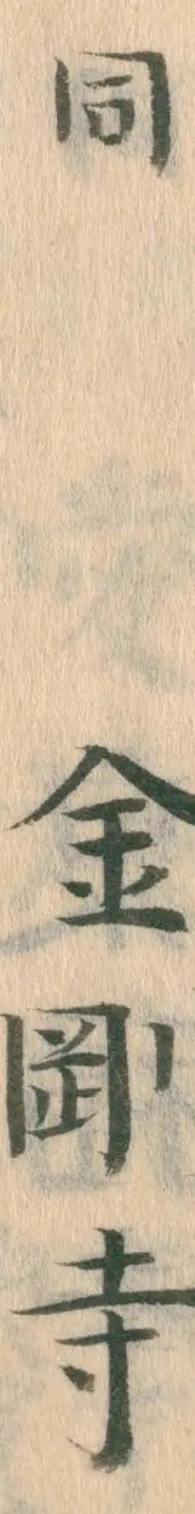同金剛院
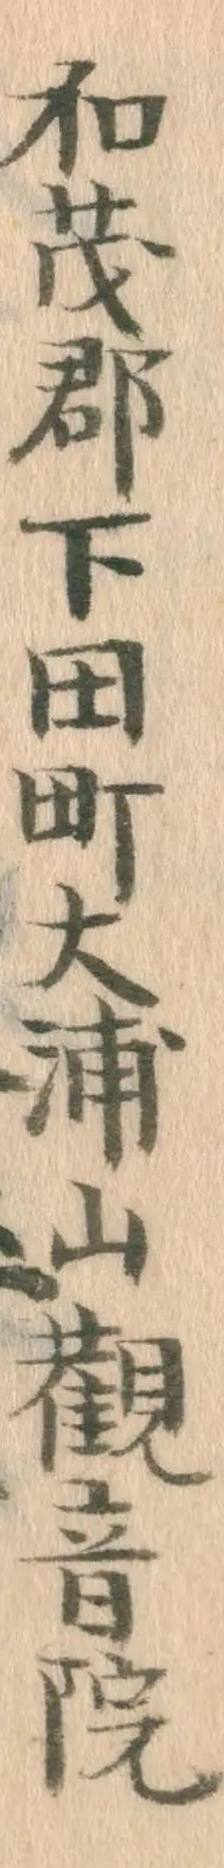賀茂郡下田町大浦山観音院
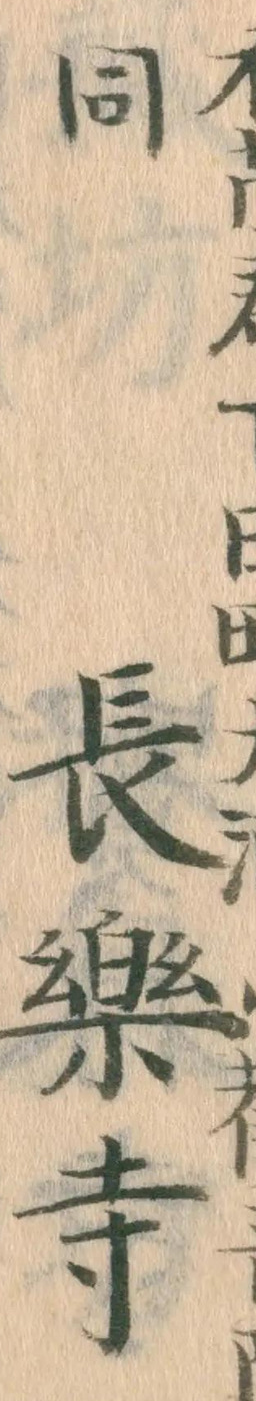同長楽寺
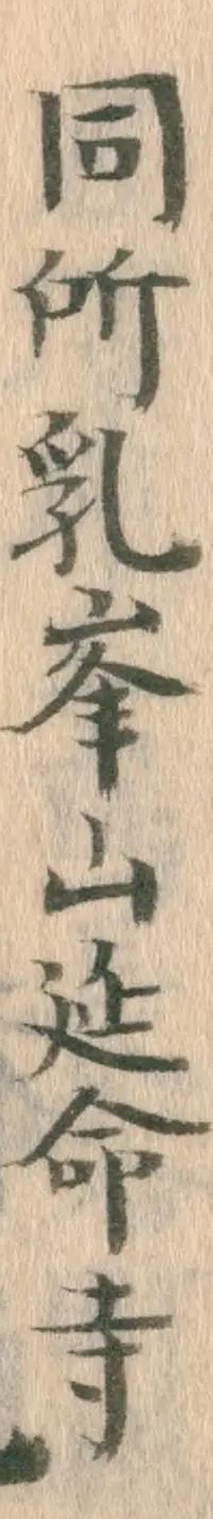同所乳峯山延命寺
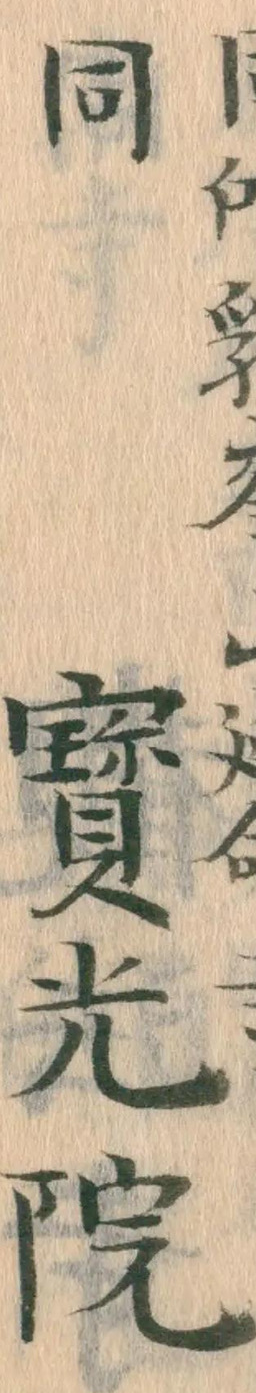同寶光院
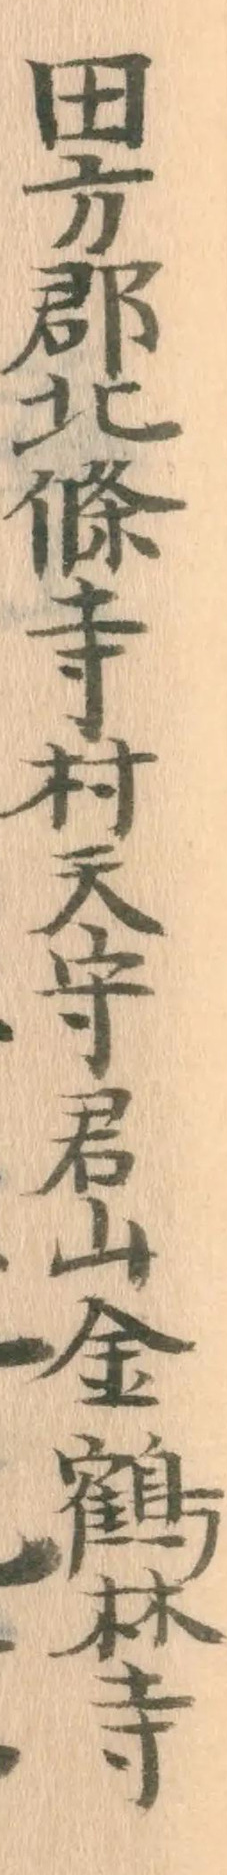田方郡北條寺村天守君山金鶴林寺
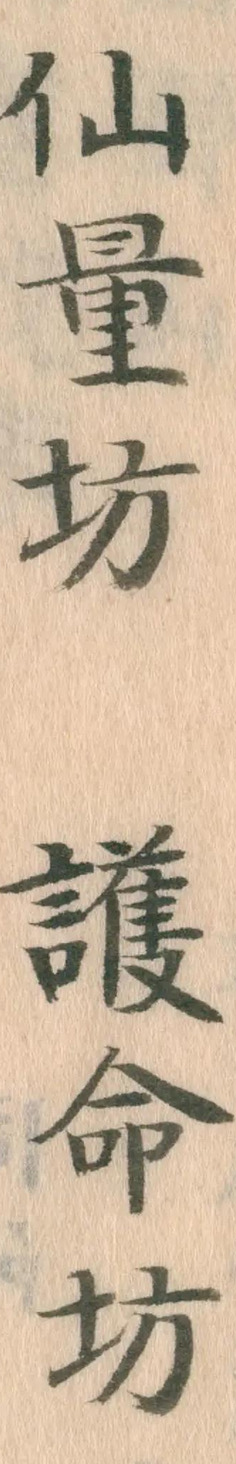仙量坊護命坊
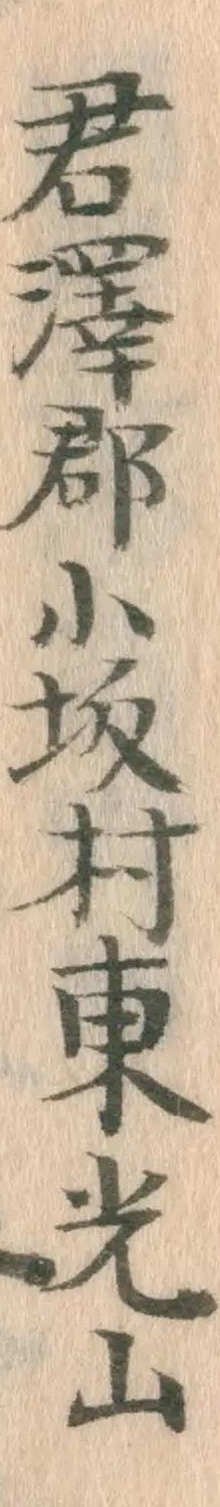君沢郡小坂村東光山
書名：古義真言宗本末帳 21巻. [4] 第三 伊賀国、伊勢国、志摩国、尾張国、三河国、遠江国、駿河国、伊豆国、甲斐国
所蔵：国立国会図書館 National Diet Library, JAPAN
